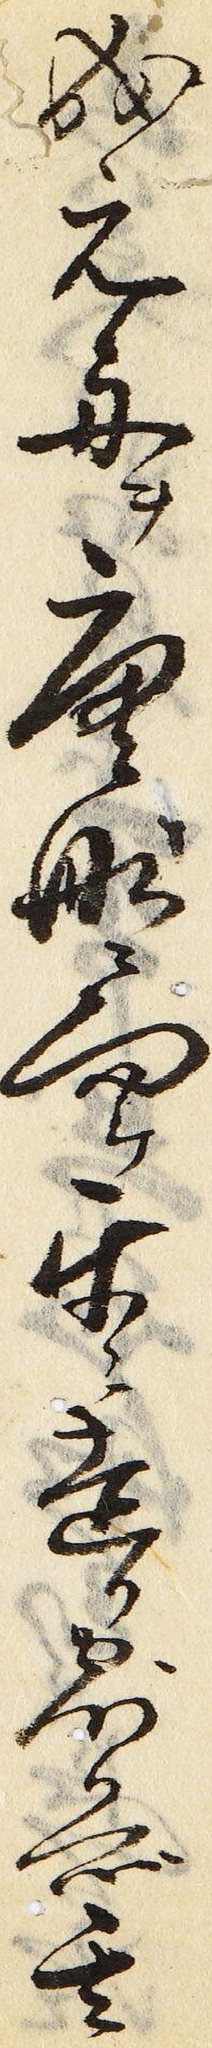成元船ヲ唐船ニ向ケ互ニ走り寄候所其
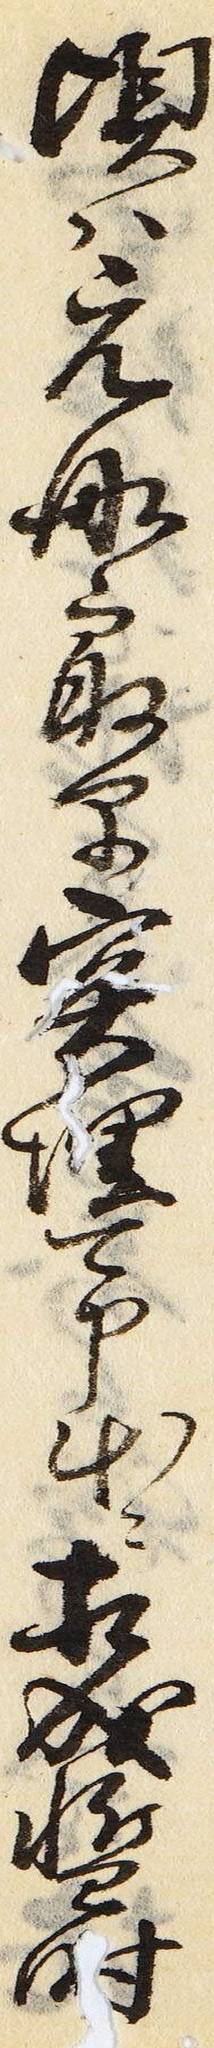頃ハ元船最早突埋可申計ニ相成暫時
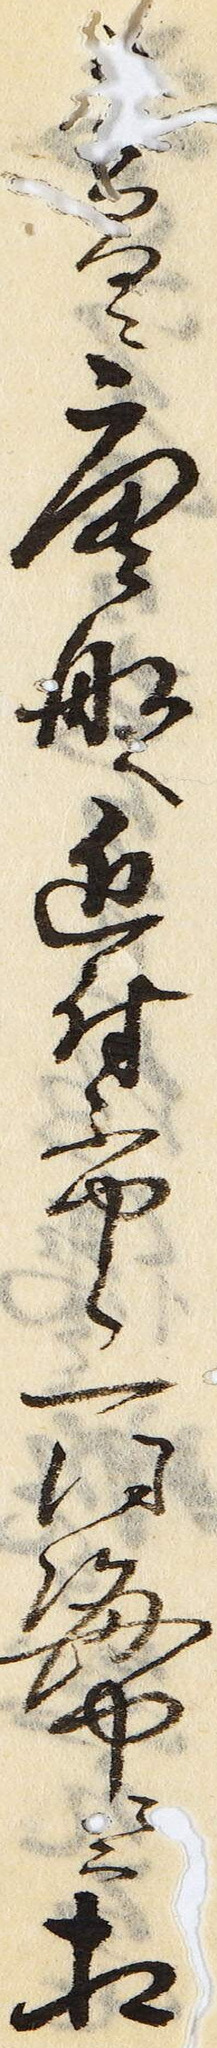間ニ唐船へ近付不申候一同海中ニ而相
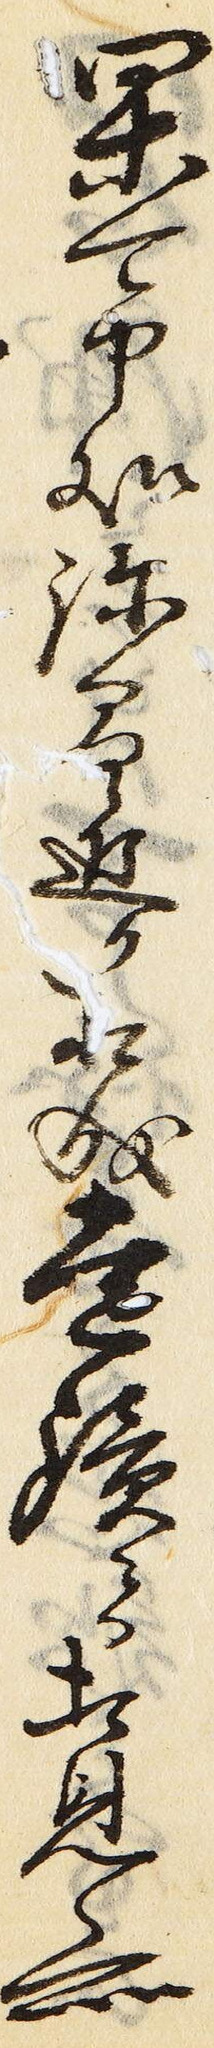果可申処弥間近ク相成遠鏡ニ而相見候所
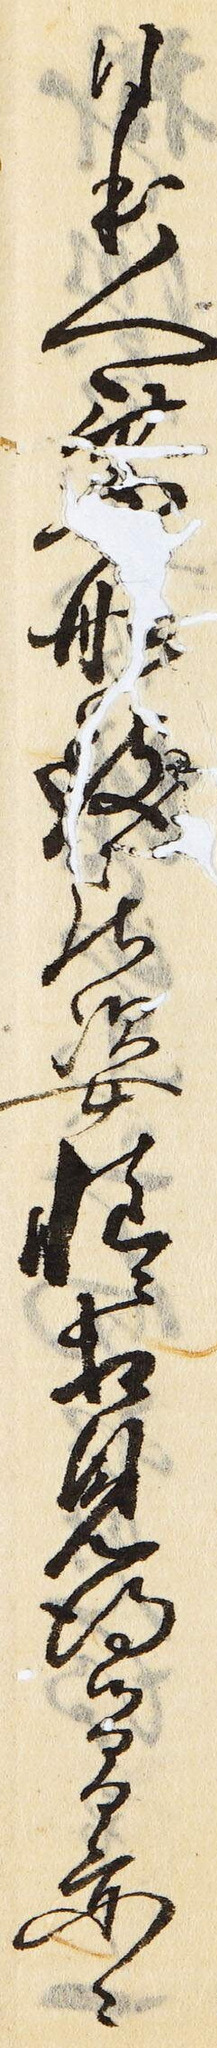日本人乗船致居姿慥ニ相見得候間亦々
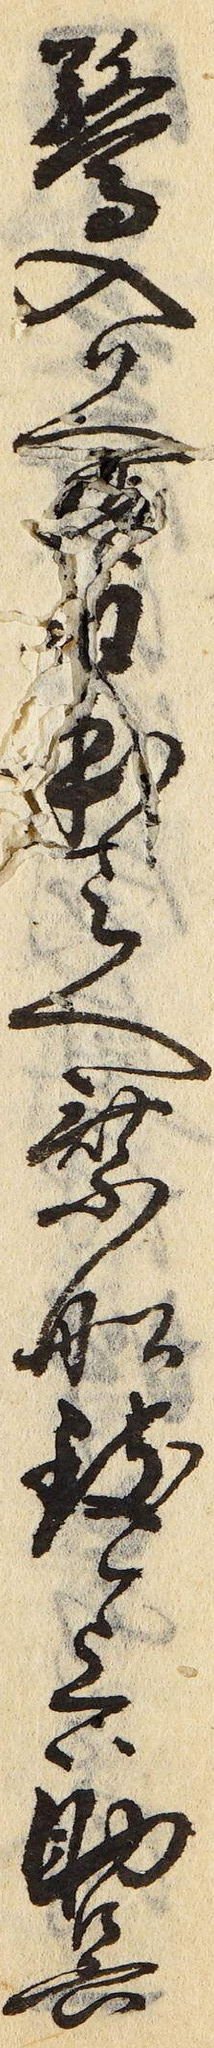驚入候へ共日本壱人乗船致候上ハ助呉
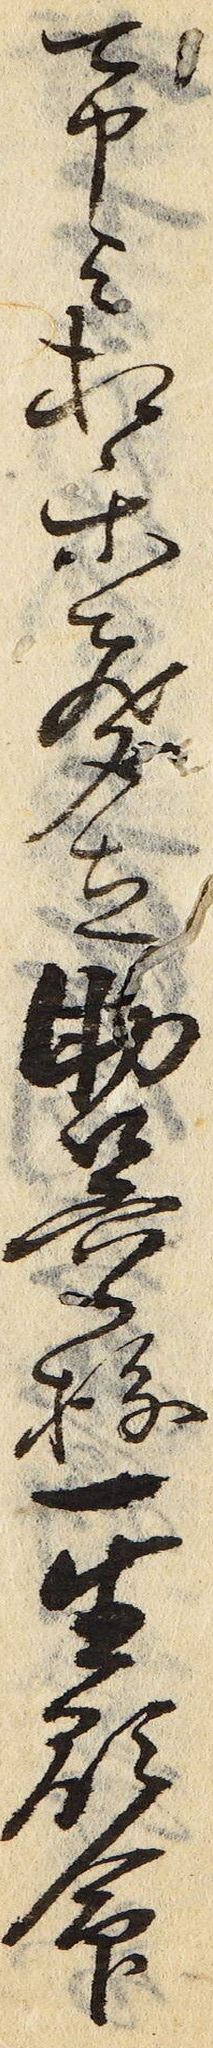可申与相互声立助呉候様一生顕命
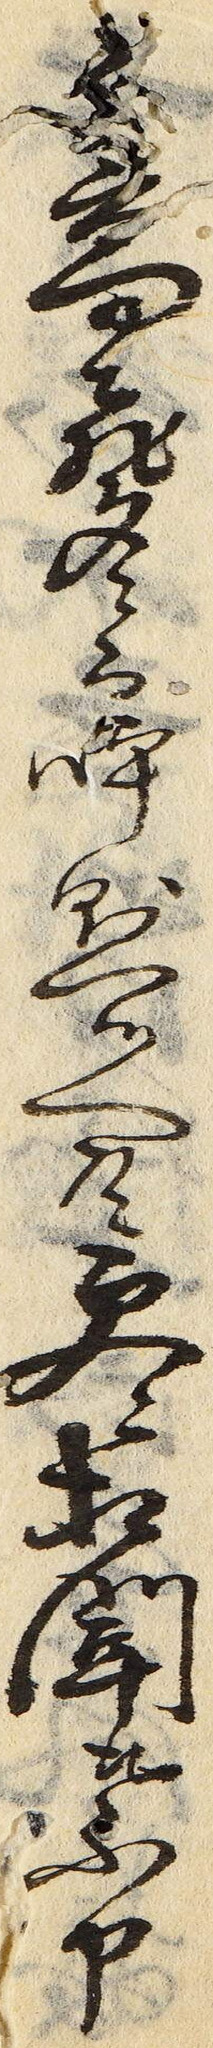高声ニ而呼懸候へ共更ニ相相聞え不申
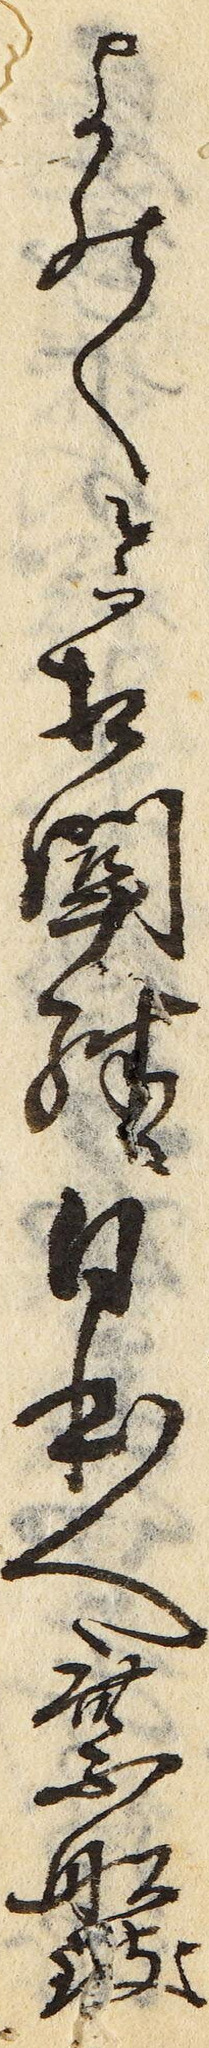よの〳〵？ニ而相聞殊ニ日本人乗船致
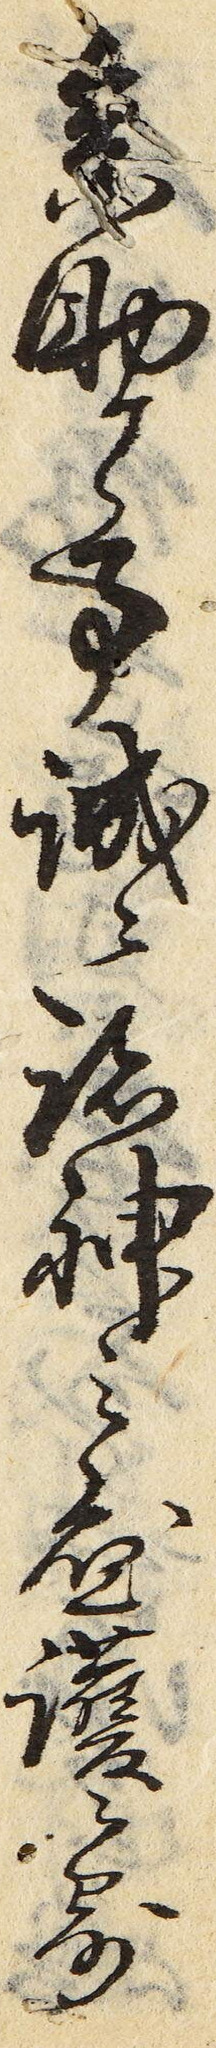乗助ケ候事誠ニ諸神之庇護ニ寄
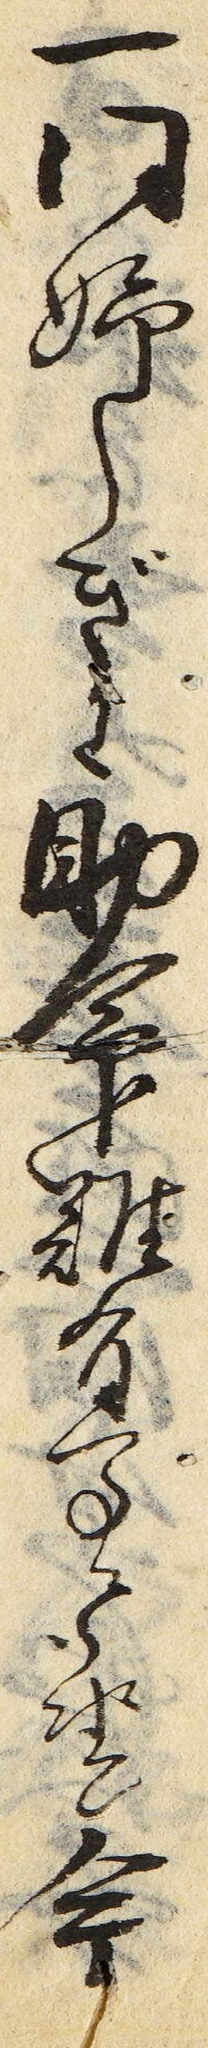一同ふしぎと助命難有事ニ御座候今
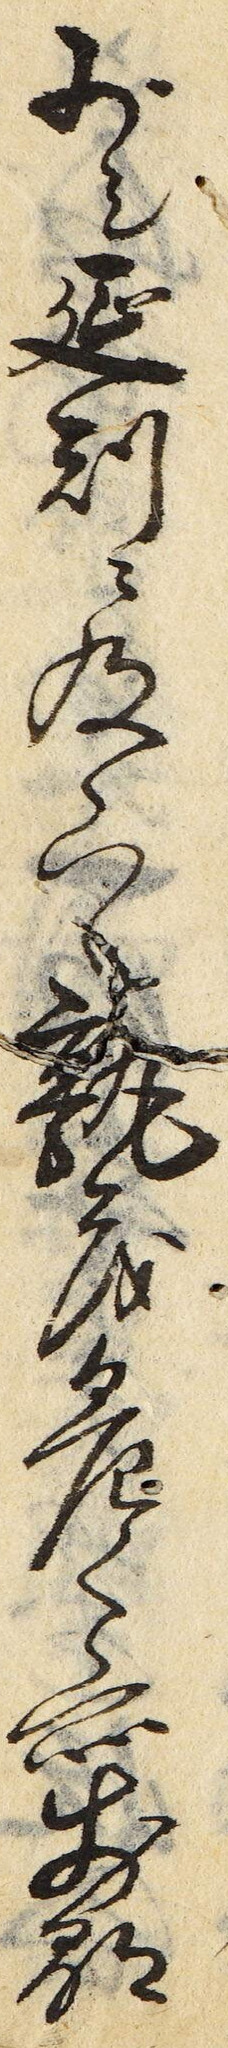少シ延刻ニ及候ハヽ孰も危く候所前顕
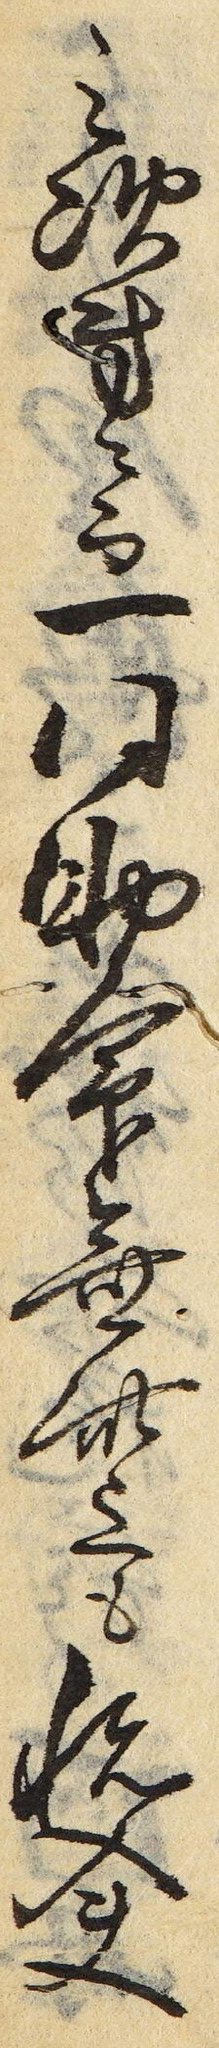之次第ニ而一同助命無此上も悦入夫

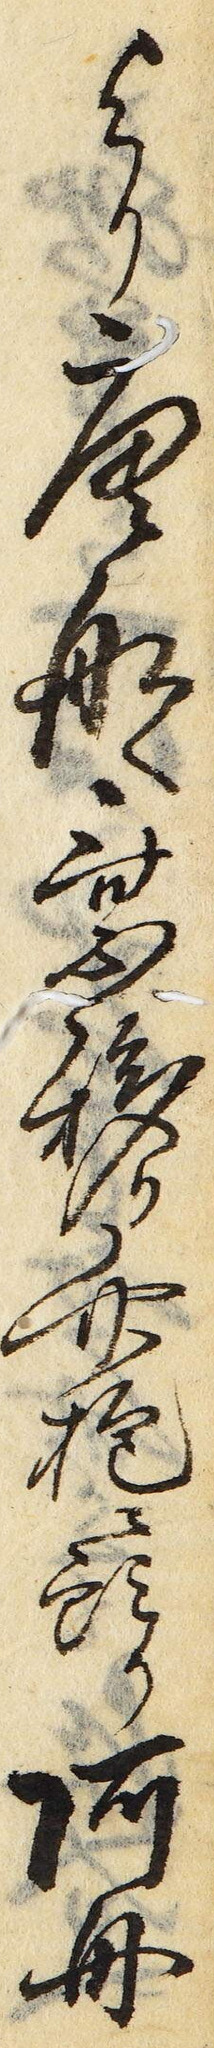より唐船へ乗移り介抱ニ預り阿舟
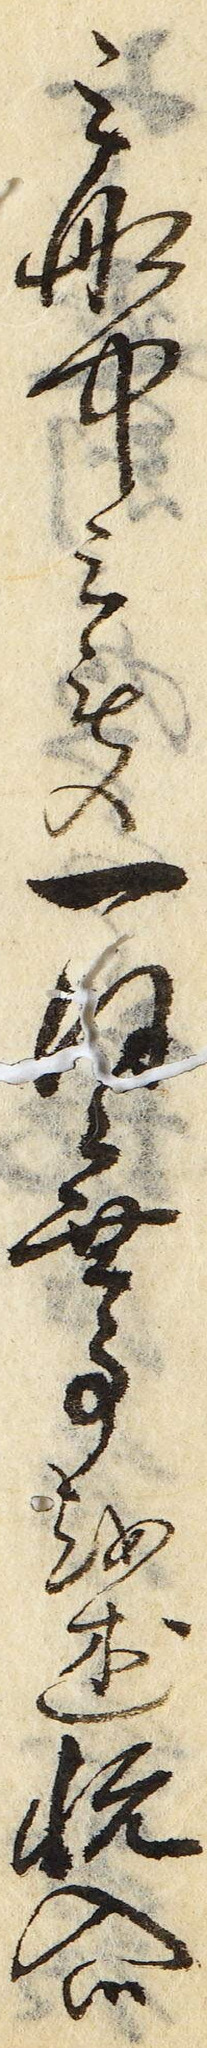之船中之もの一同之無事を述悦入候
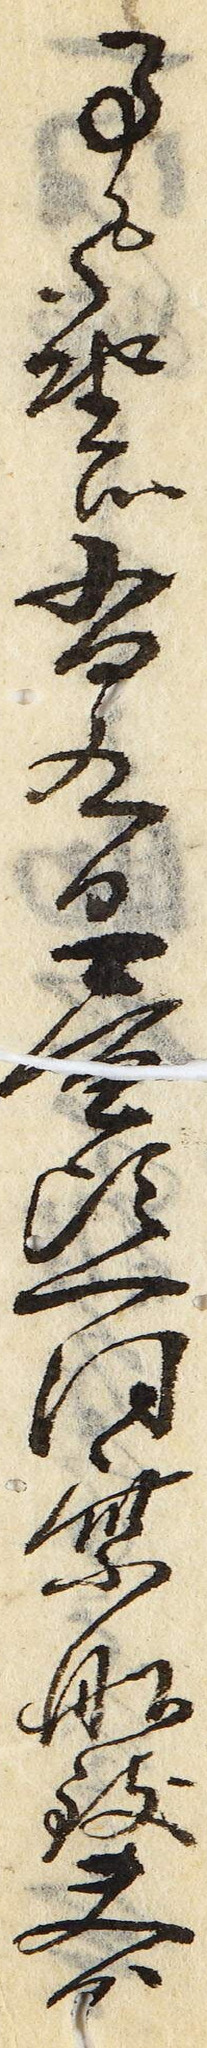事も御座候尚九日昼頃一同乗船致夫ゟ
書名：阿波幸宝丸漂流記
